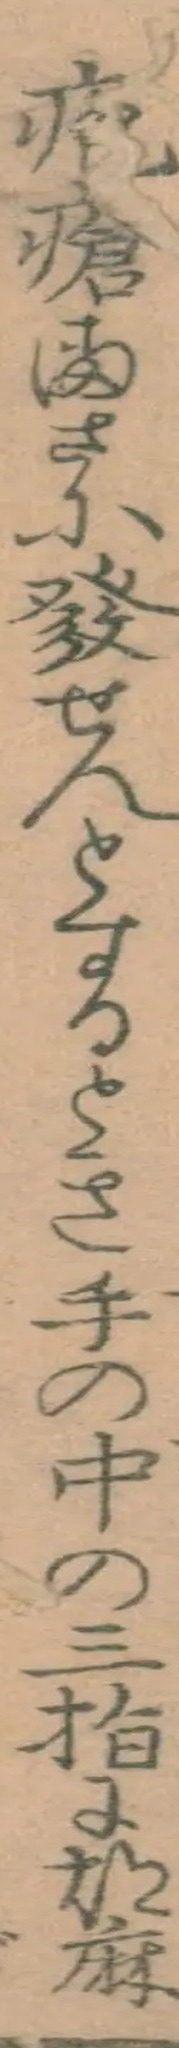疱瘡まさに発せんとするとき手の中の三指に胡麻
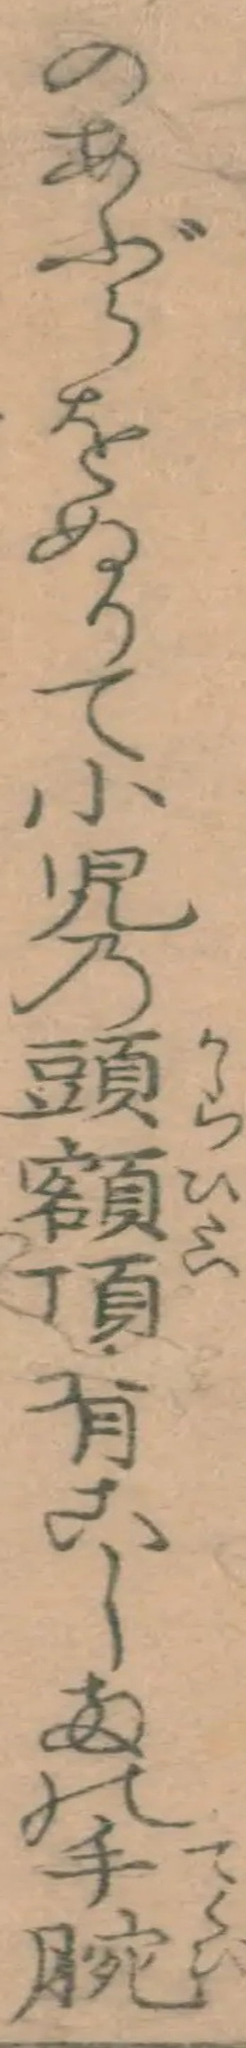のあぶらをぬりて小児の頭額頂背こし両の手腕
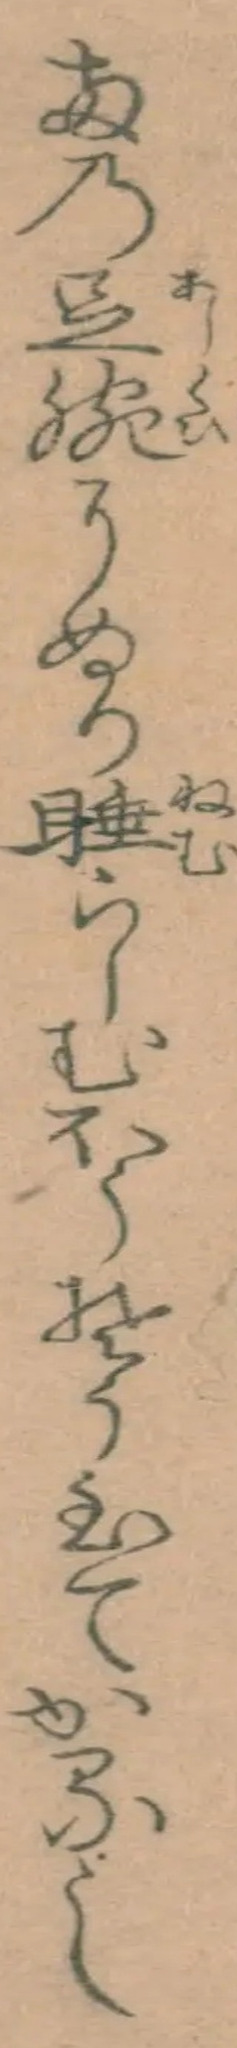両の足腕にぬり睡らしむほうそう至てかるし
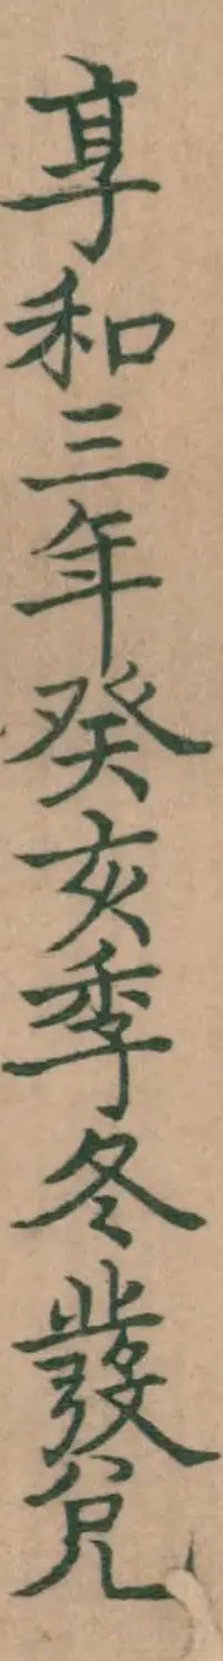享和三年癸亥季冬発兌
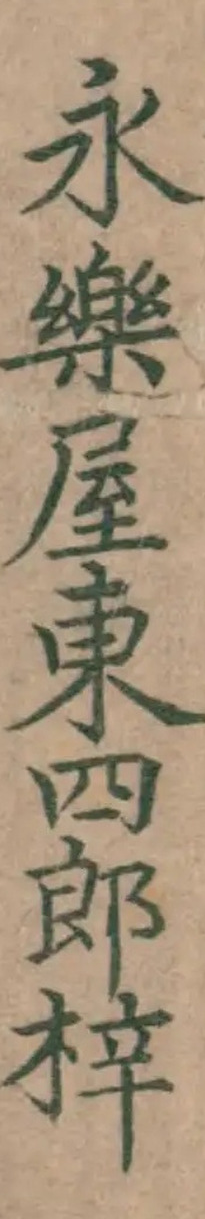永楽屋東四郎梓
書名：雨夜談
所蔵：国立国会図書館 National Diet Library, JAPAN
